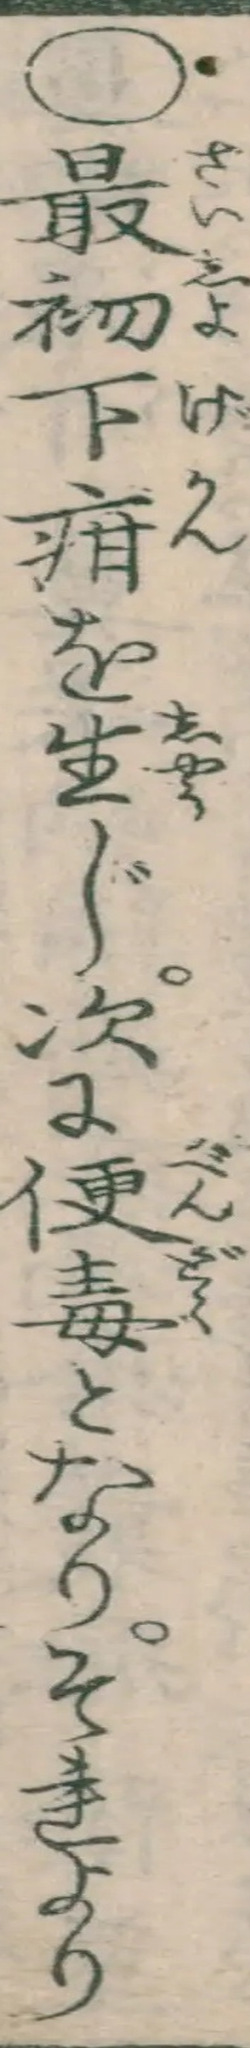○最初下疳を生じ。次に便毒となり。それより
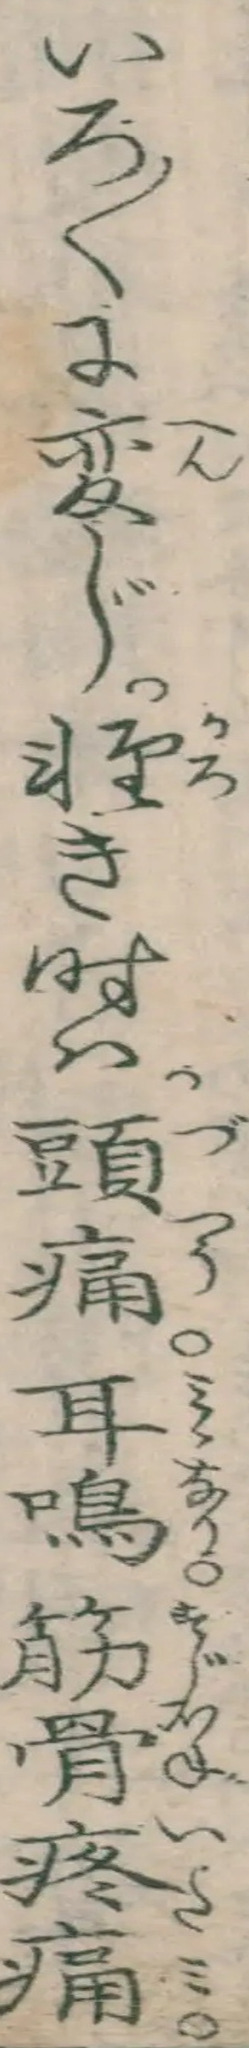いろ〳〵に変じ。軽き時は。頭痛。耳鳴。筋骨疼痛。

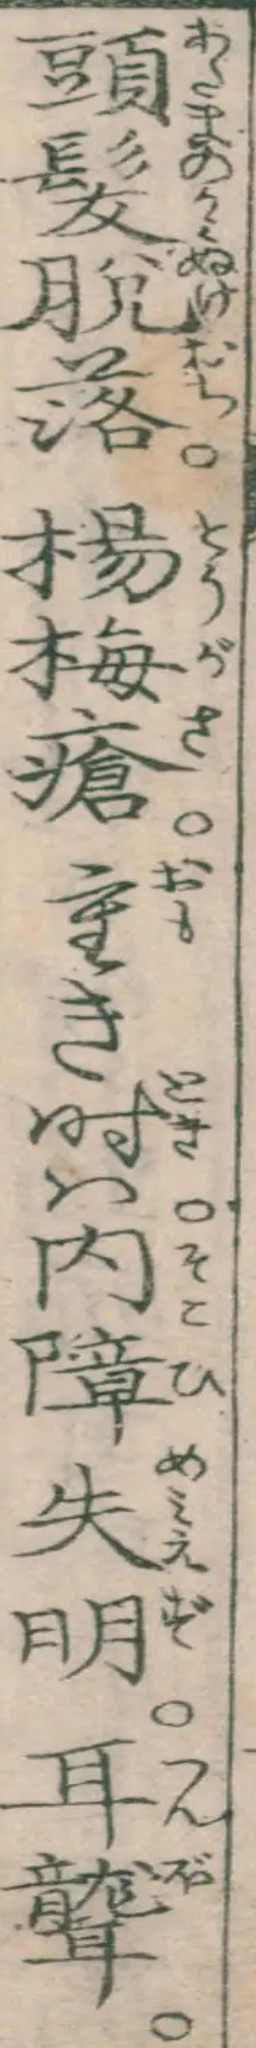頭髪脱落。楊梅瘡。重き時は。内障失明。耳聾。
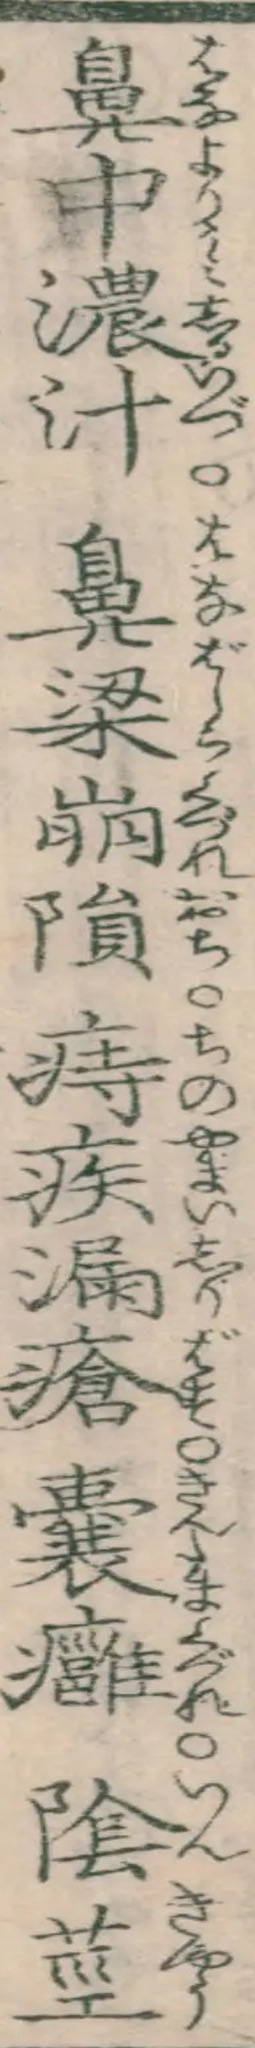鼻中濃汁。鼻梁崩隕。痔疾漏瘡。嚢癰。陰莖
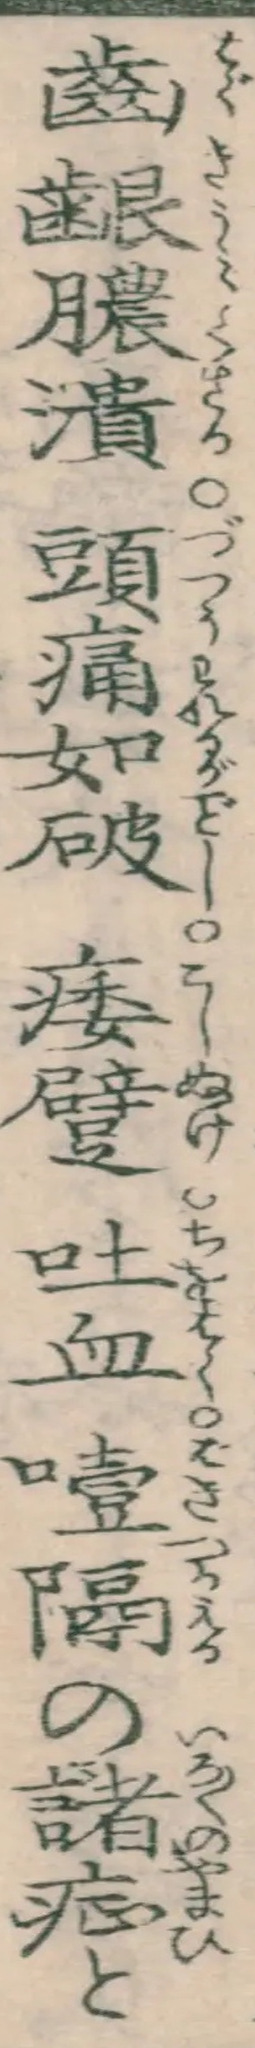歯齦膿潰。頭痛如破。痿躄。吐血。噎隔の諸症と
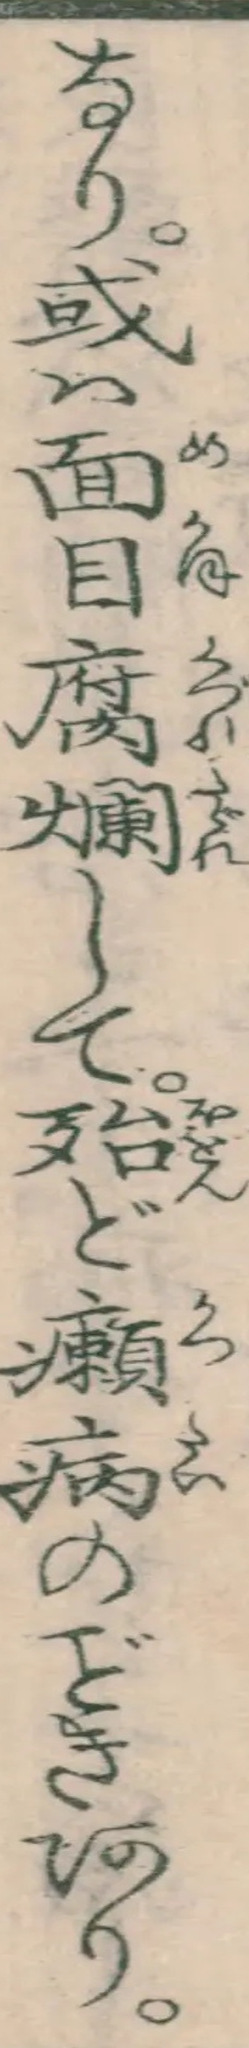なり。或は面目腐爛して。殆ど癩病のごときあり。
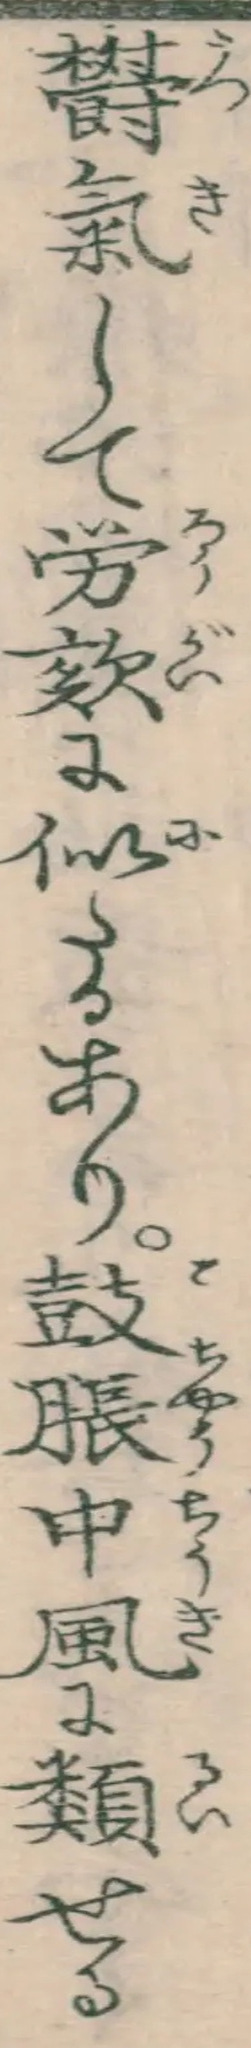鬱氣して労咳に似たるあり。鼓脹中風に類せる
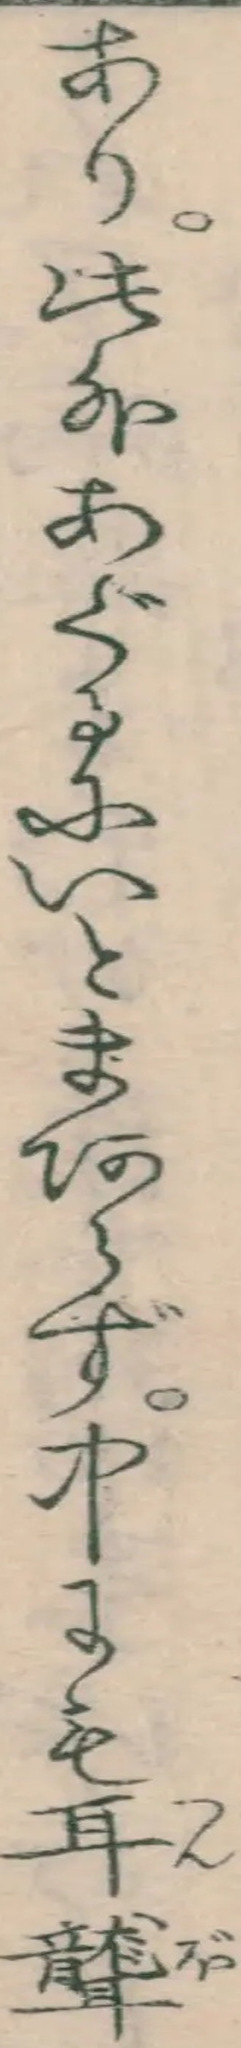あり。此外あぐるにいとまあらず。中にも耳聾
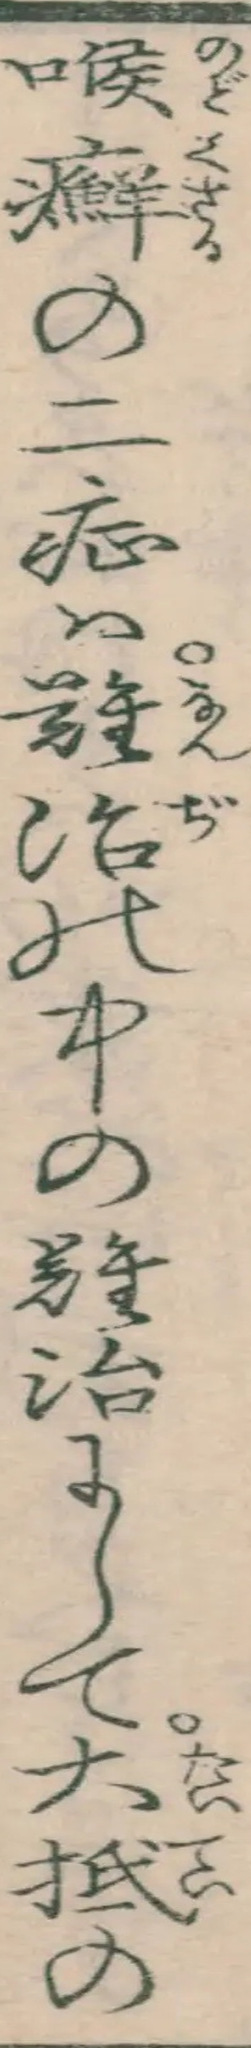喉癬の二症は。難治の中の難治にして。大抵の
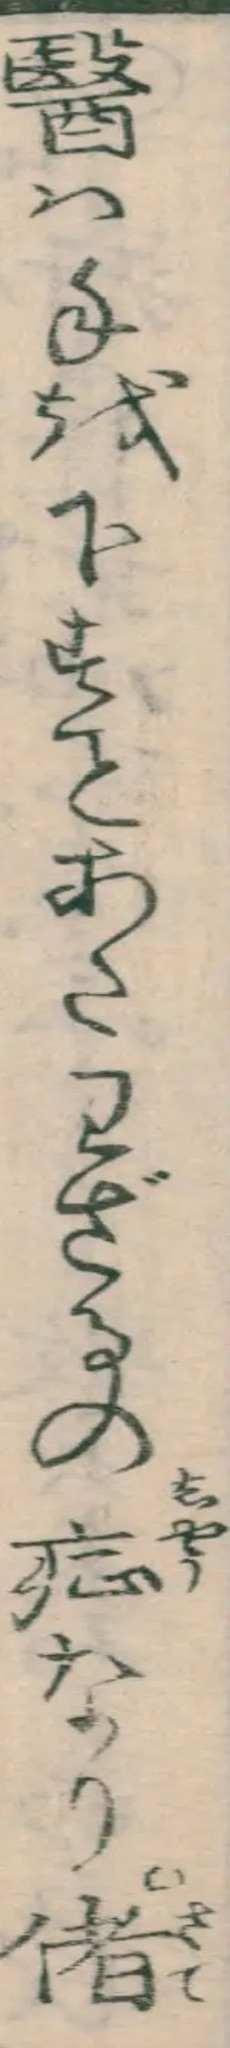醫は手を下すことあたわざるの症なり。偖
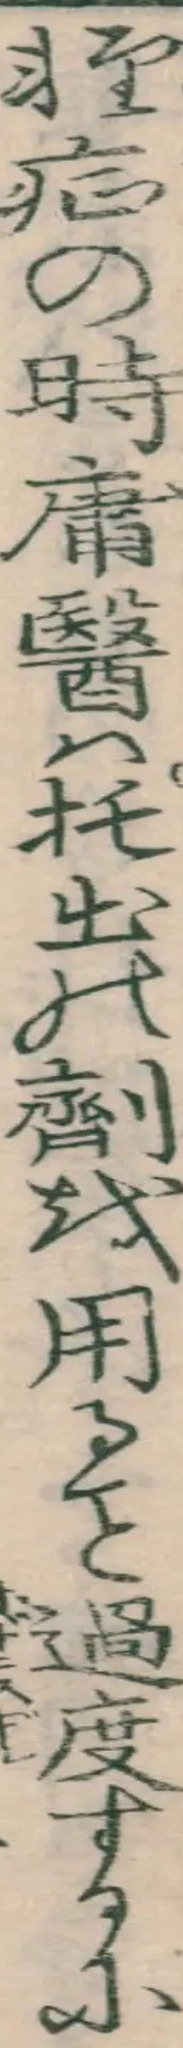軽症の時庸醫は。托出の剤を用ること過度するに
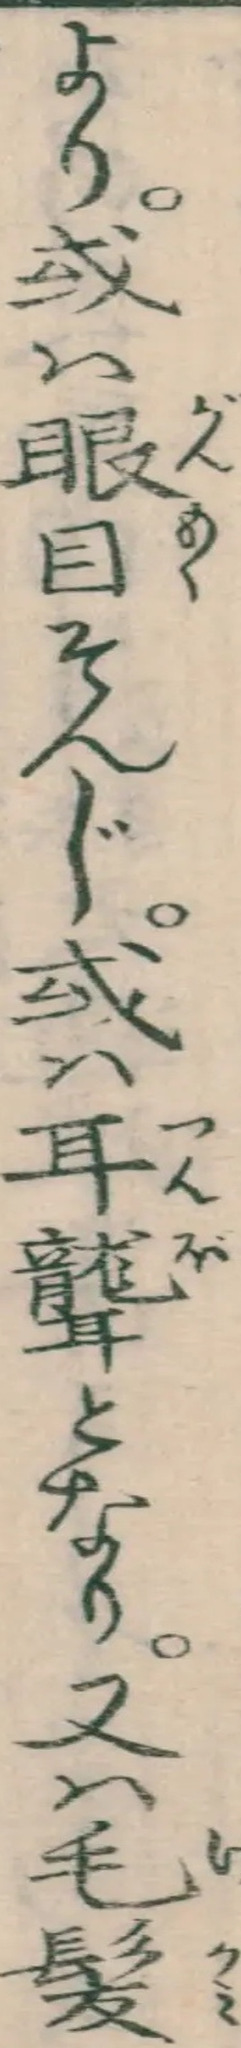より。或は眼目そんじ。或は耳聾となり。又は毛髪
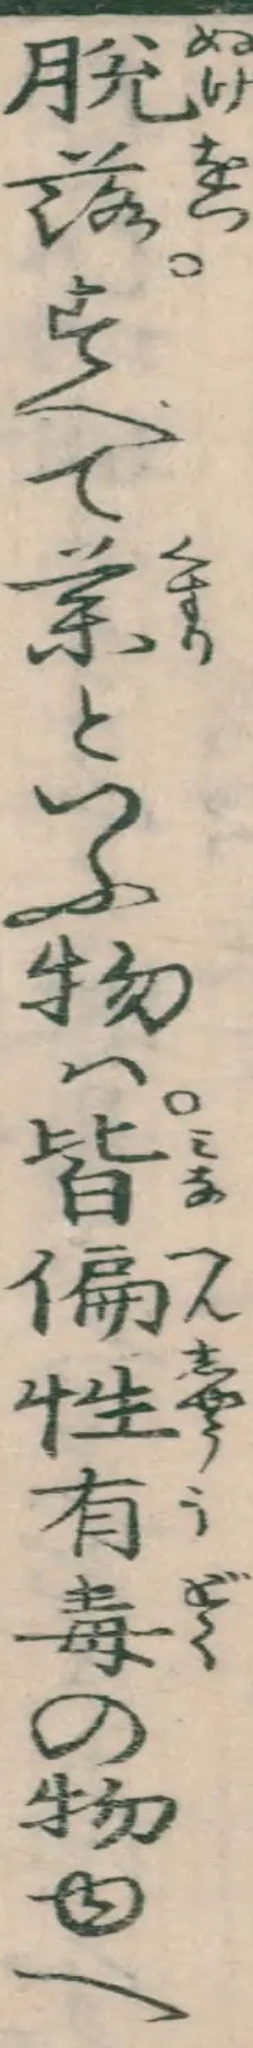痜落。すへて薬といふ者は。皆偏性有毒の物ゆへ
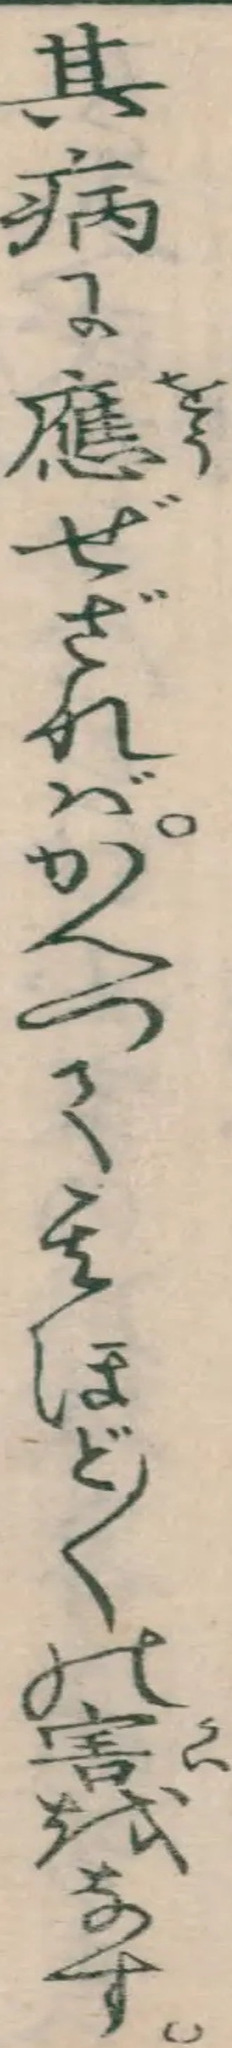其病に應ぜざれば。かへつて其ほど〳〵の害をなす。
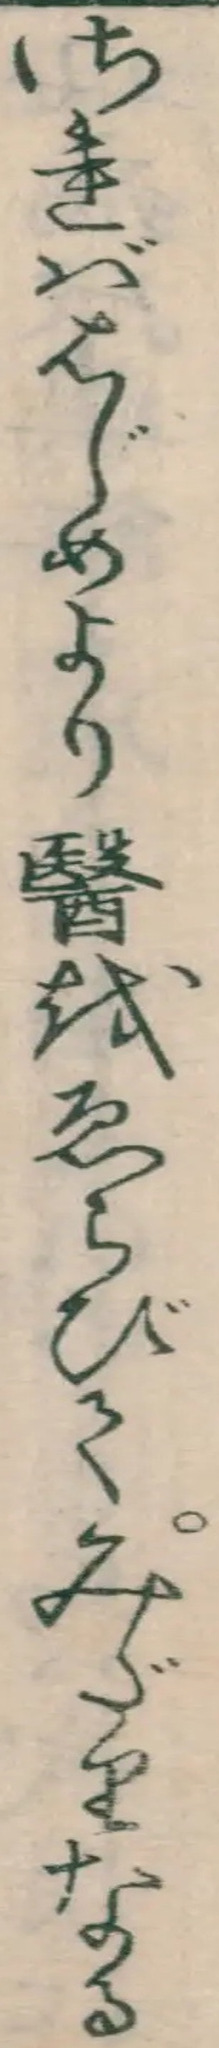さればはじめより醫をゑらびて。みだりなる
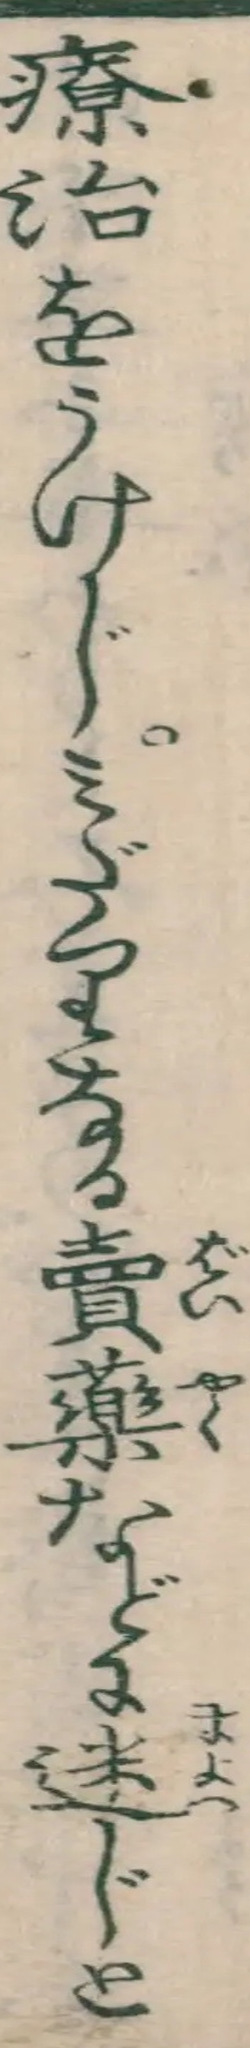療治をうけじ。みだりなる賣薬などに迷じと
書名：瘡家示訓
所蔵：国立国会図書館 National Diet Library, JAPAN
